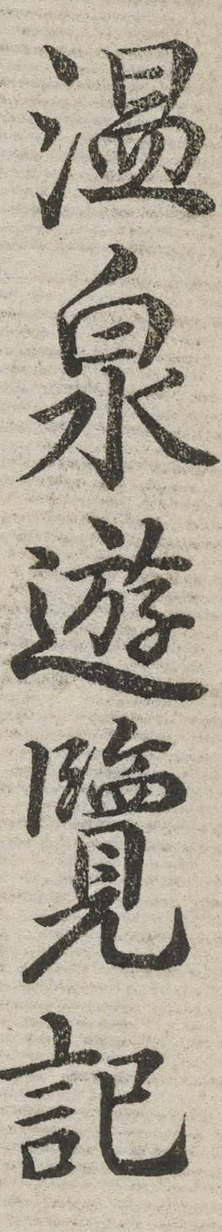温泉遊覧記
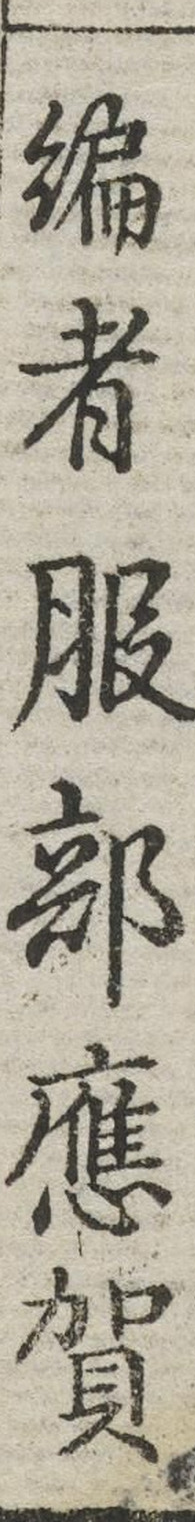編者服部応賀
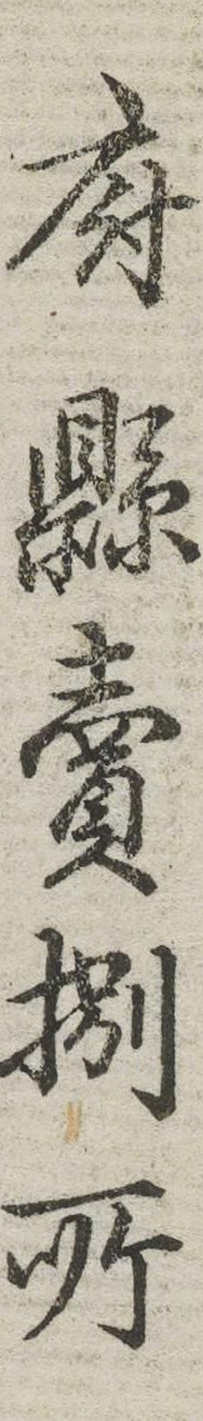府県売捌所
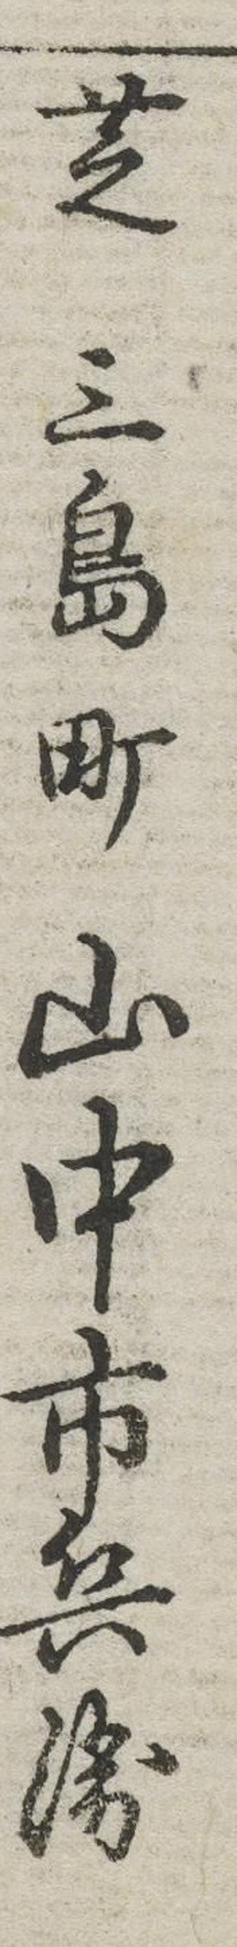芝三島町山中市兵衛
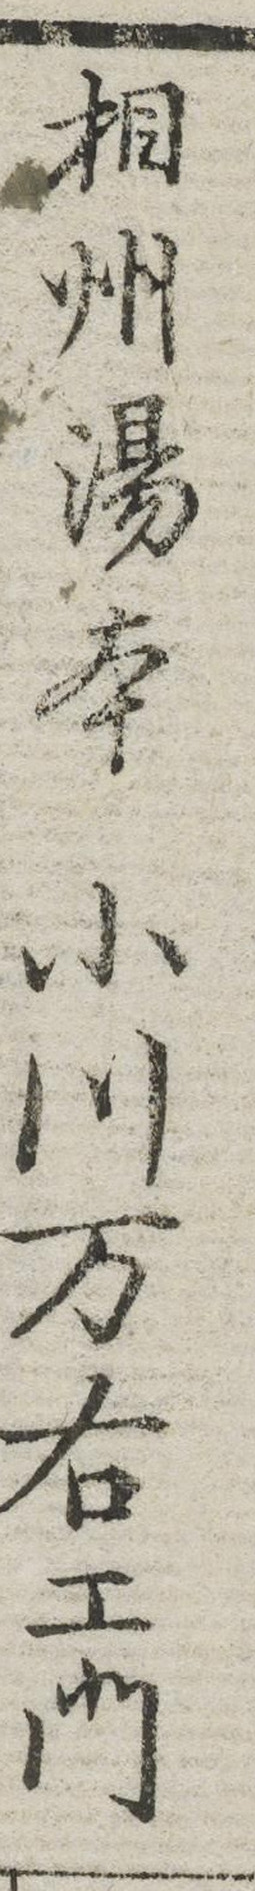相州湯本小川万右エ門
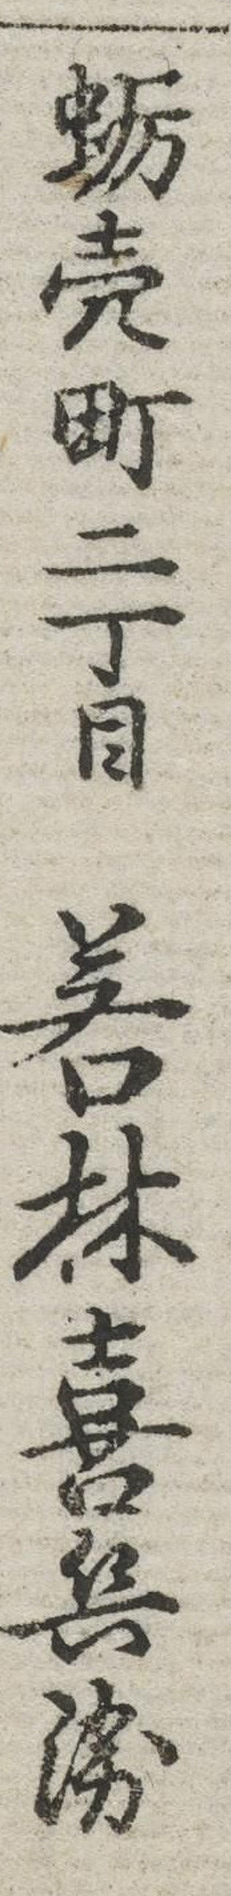蛎売町二丁目若林喜兵衛
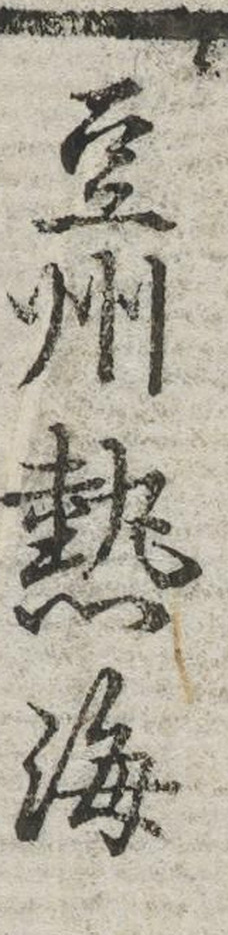豆州熱海
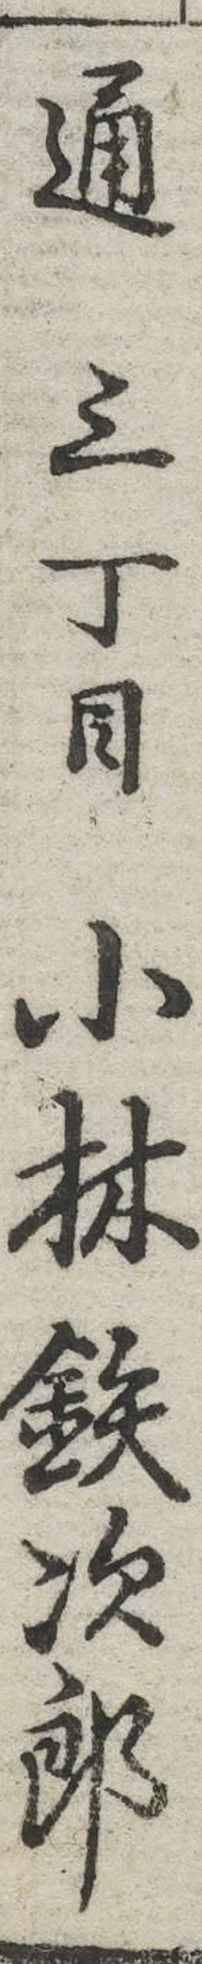通三丁目小林鉄次郎
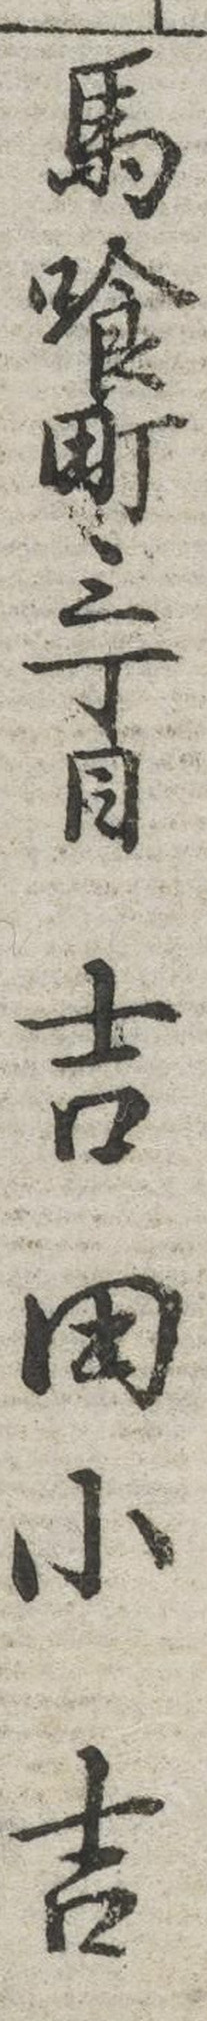馬喰町三丁目吉田小吉
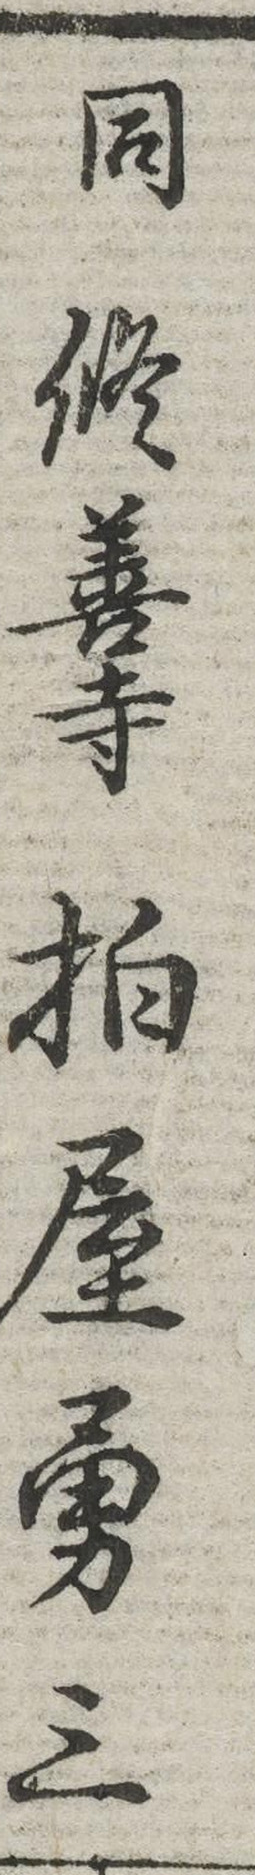同修善寺柏屋雄三
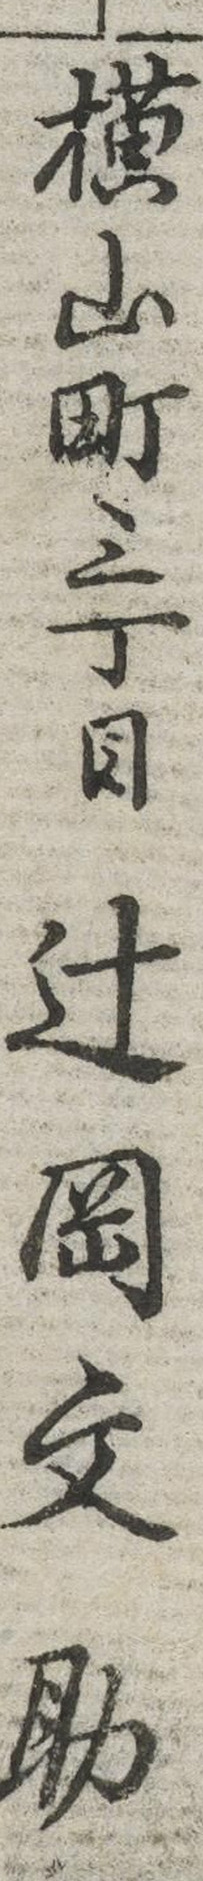横山町三丁目辻岡文助
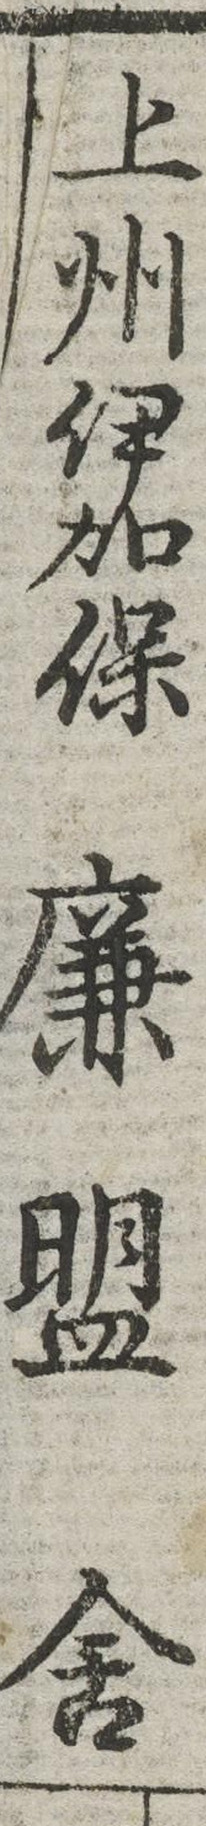上州伊香保廉盟舎
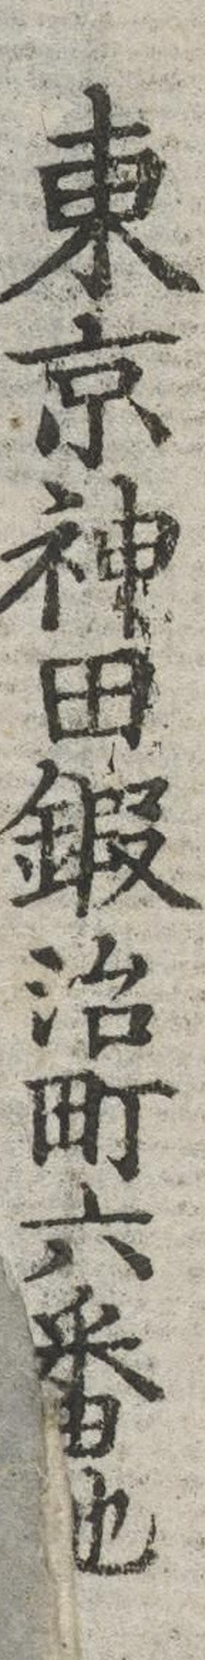東京神田鍛冶町六番地
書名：諸國温泉遊覽記　全
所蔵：東京大学地震研究所図書室 Earthquake Research Institute Library, The University of Tokyo, JAPAN
